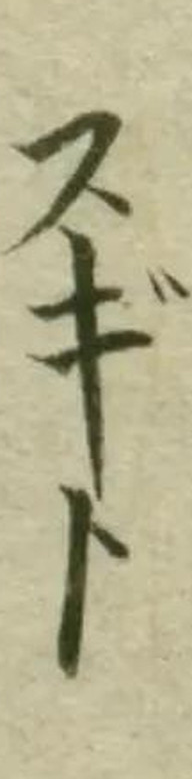スギト
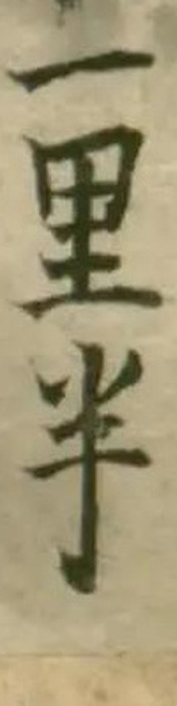一里半
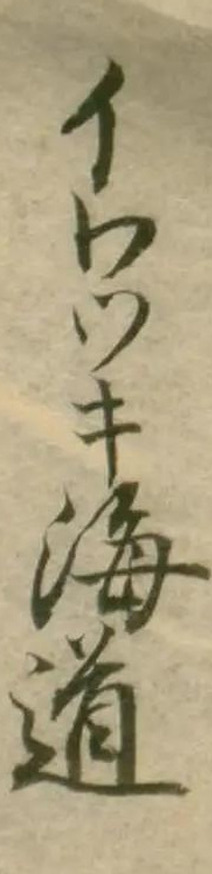イワツキ海道

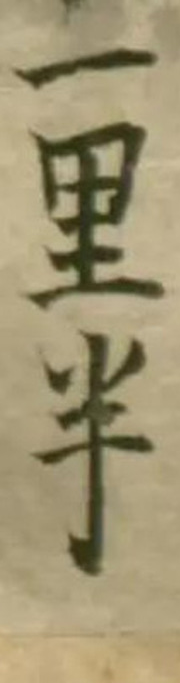一里半
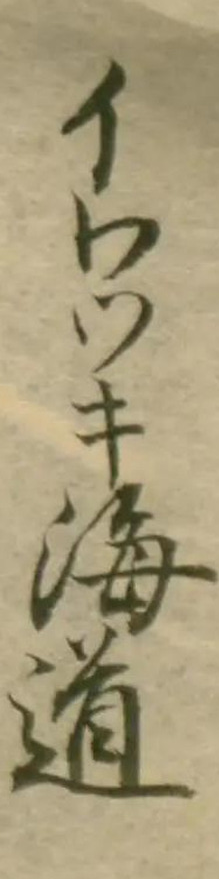イワツキ海道
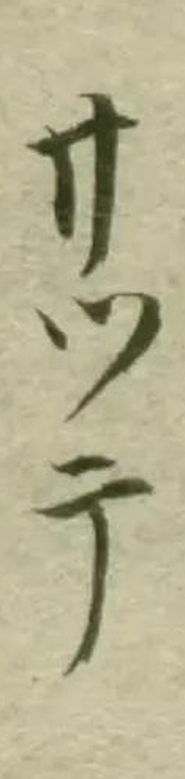サッテ
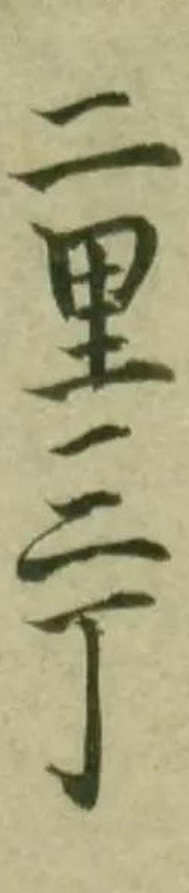二里三丁
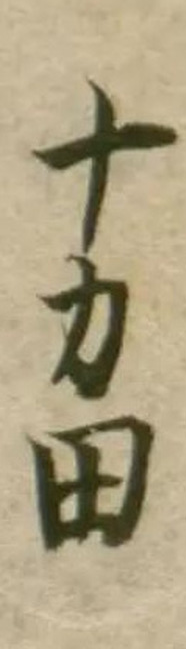ナカ田

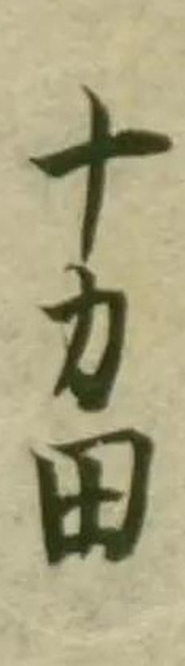ナカ田
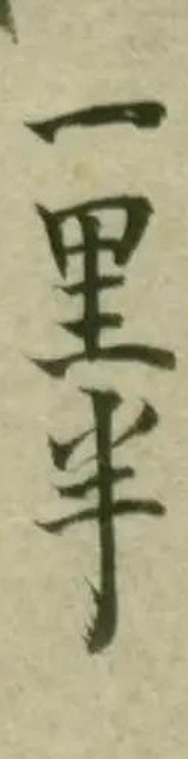一里半
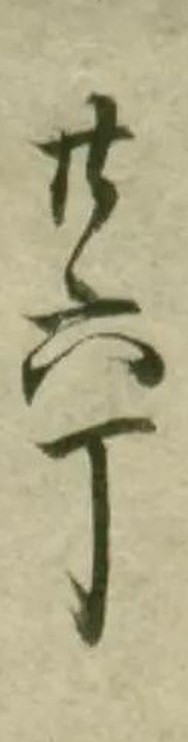廿六丁
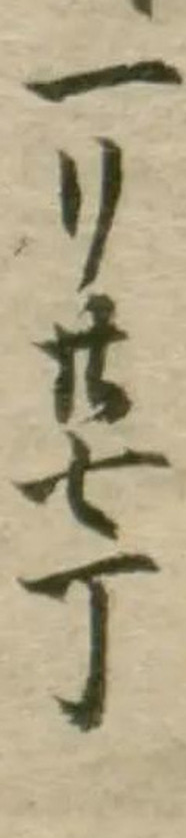一リ廿七丁

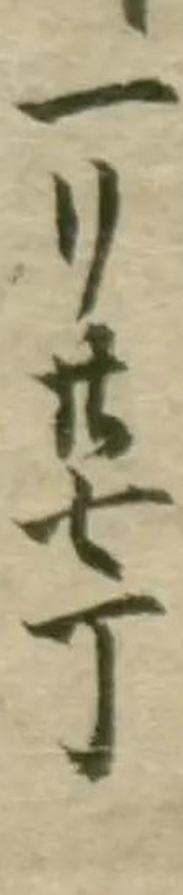一リ廿七丁
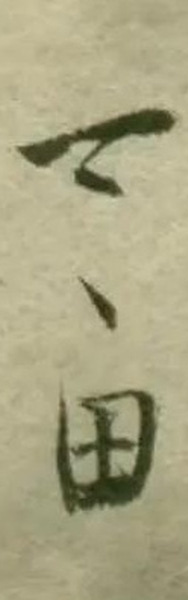マヽ田
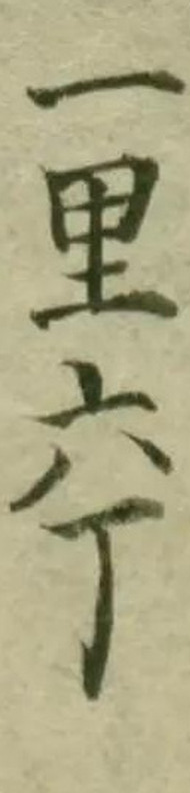一里六丁
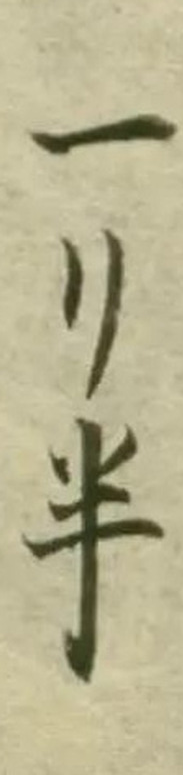一リ半
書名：江戸より奥州津輕迄道筋之圖
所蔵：国立国会図書館 National Diet Library, JAPAN
